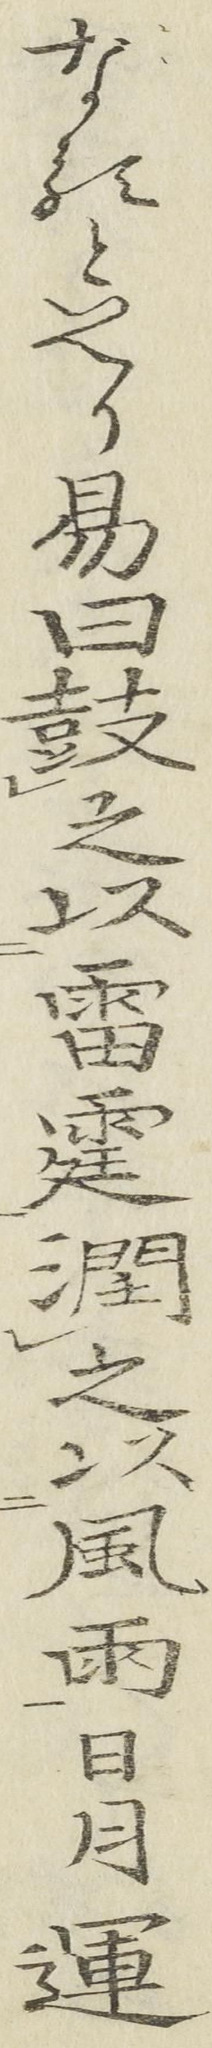なるといへり易曰鼓之以雷霆潤レ之以風雨日月運
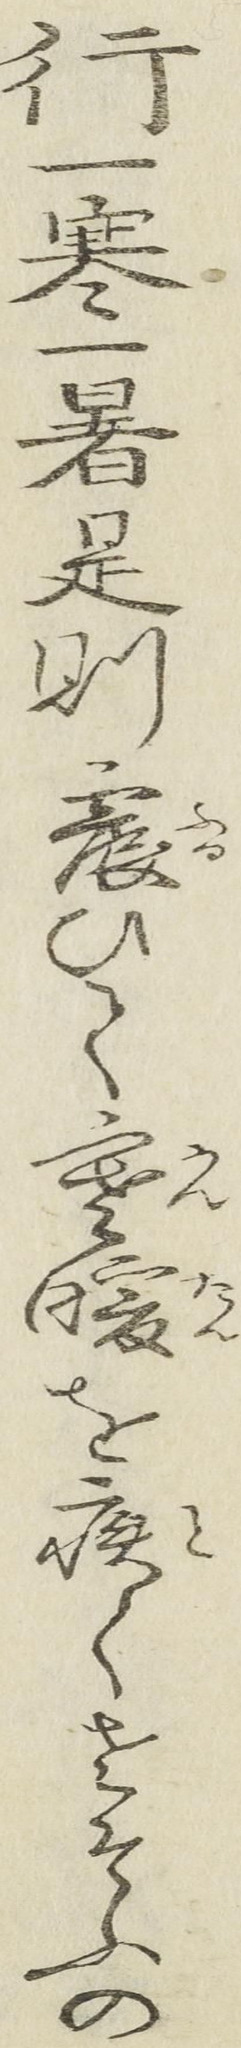行一寒一暑是則震ひて寒暖を疾くさそふの
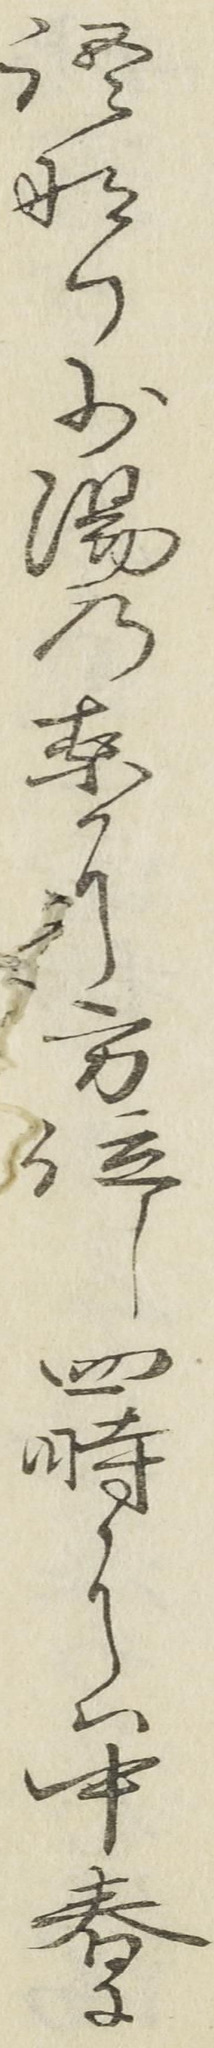語なり少陽の東に方位し四時には中春に
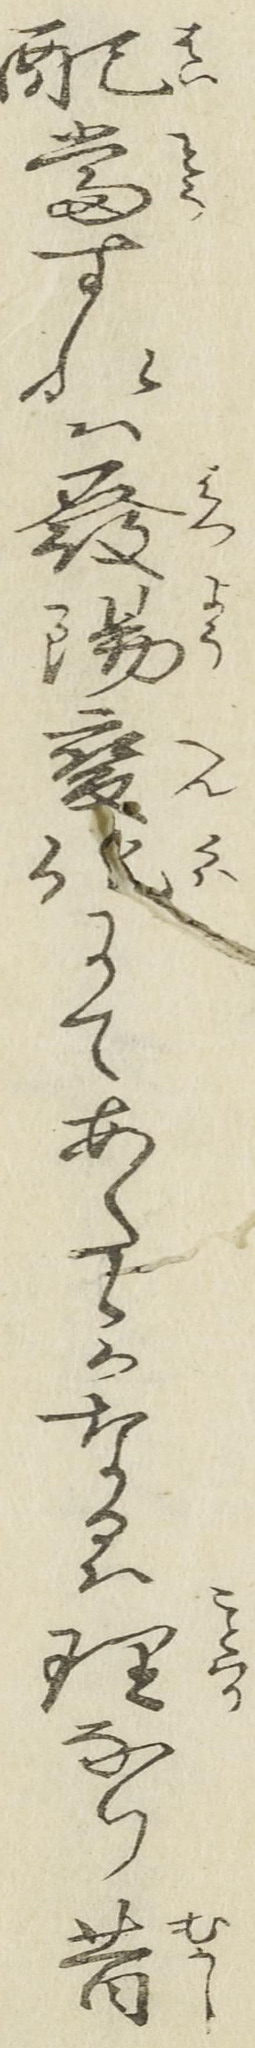配当すれは發陽変化にてあたゝかなるは理なり昔
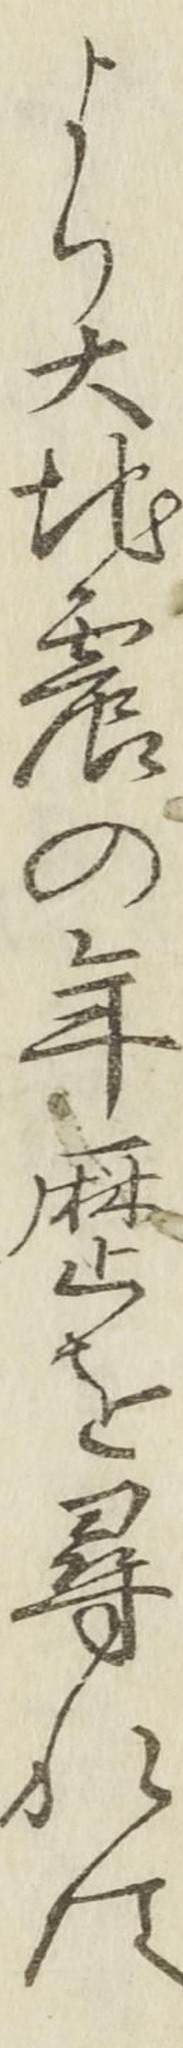より大地震の年歴を尋れは
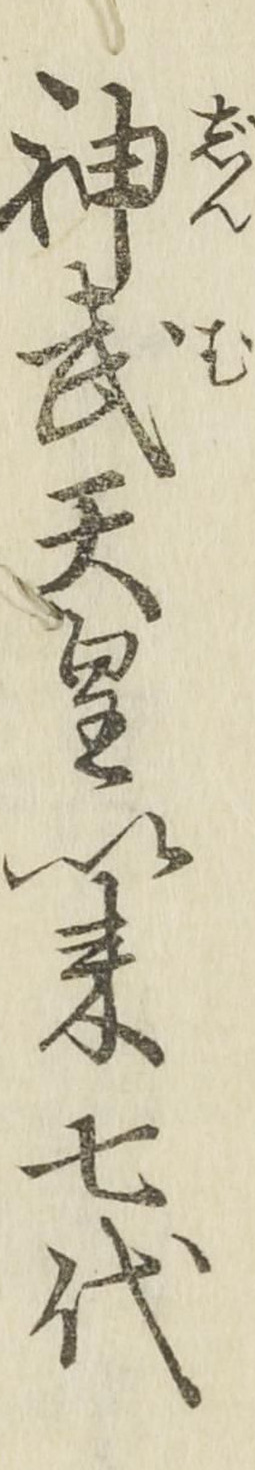神武天皇以来七代
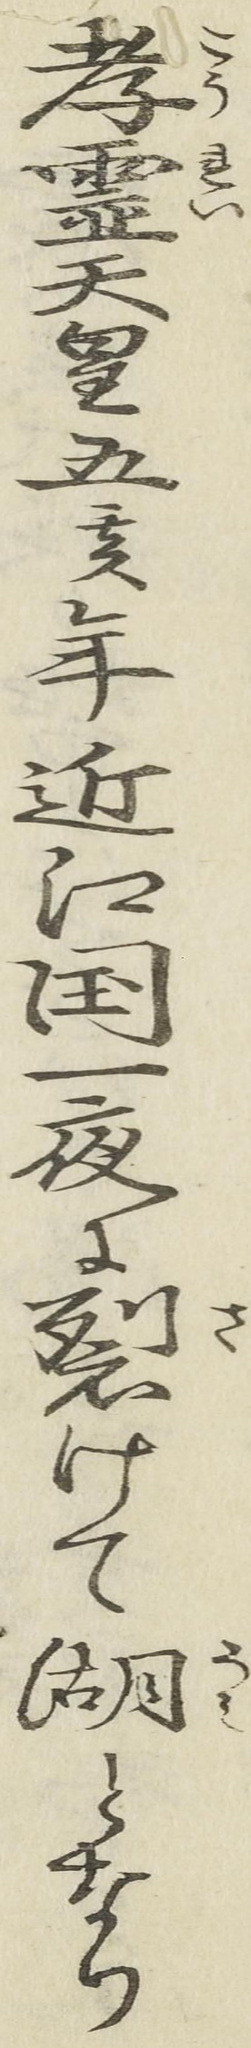孝霊天皇五亥年近江国一夜に裂けて湖となり
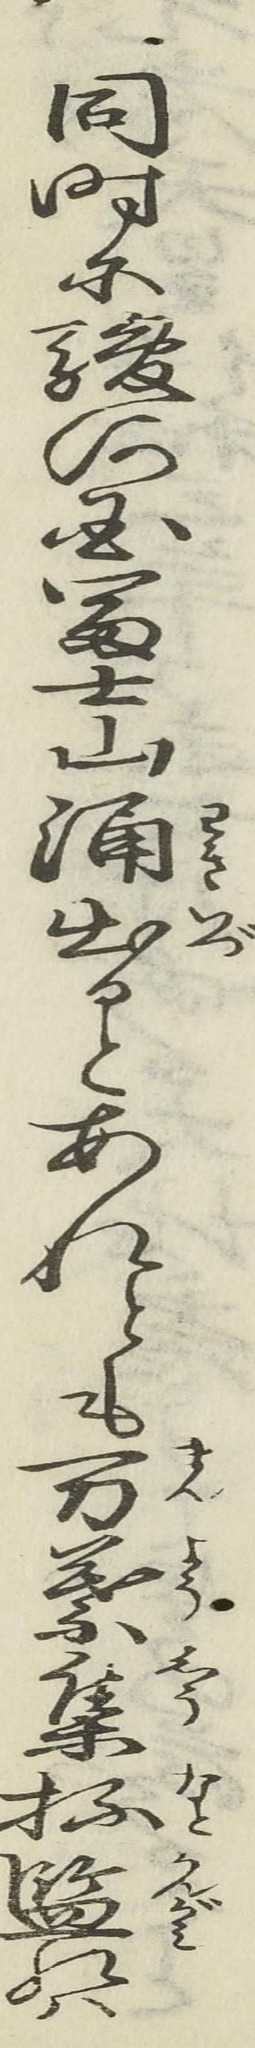同時に駿河国富士山湧出るとあれとも万葉集杯監れは
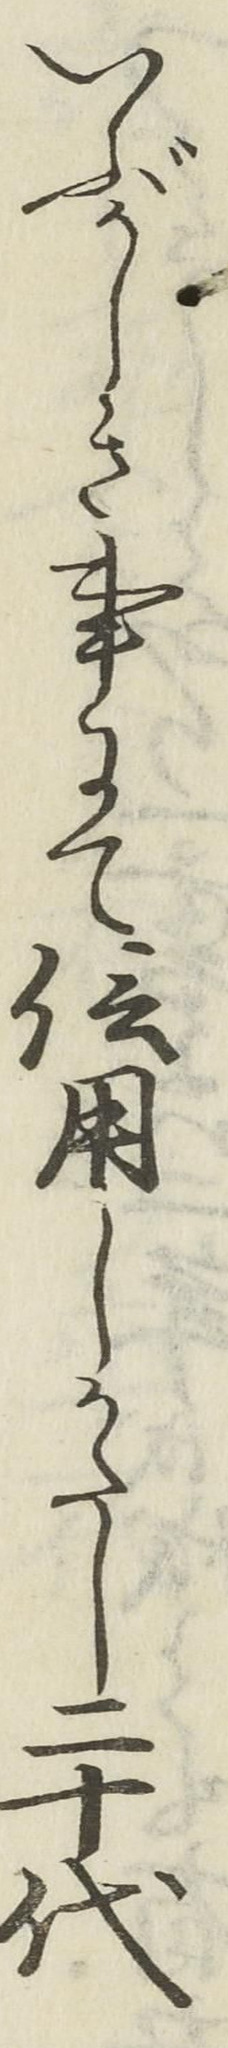いぶかしき事にて信用しかたし二十代
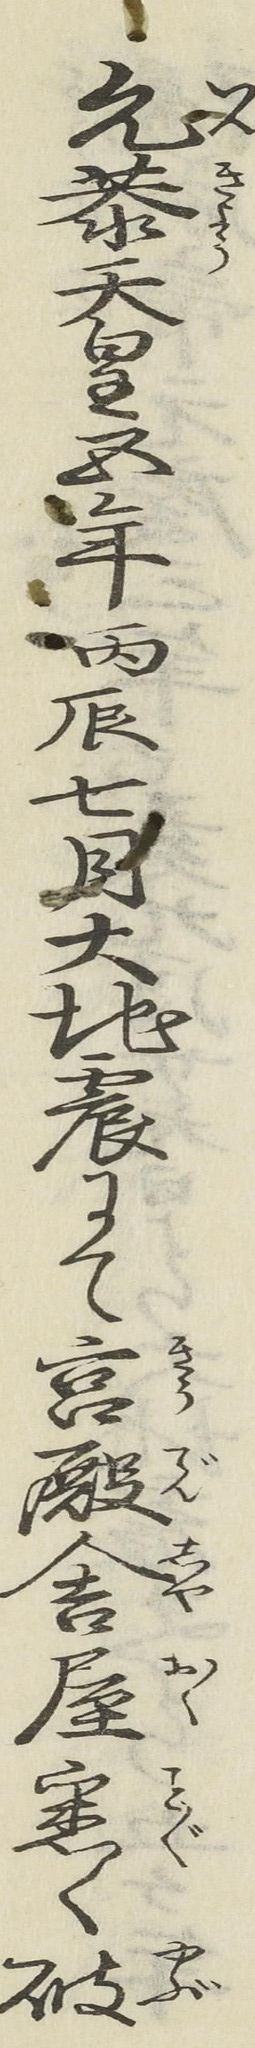允恭天皇五年丙辰七月大地震にて宮殿舎屋悉く破
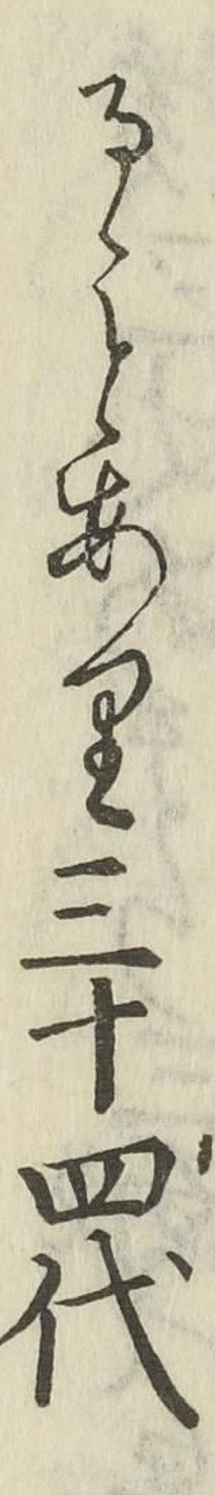るゝとあり三十四代
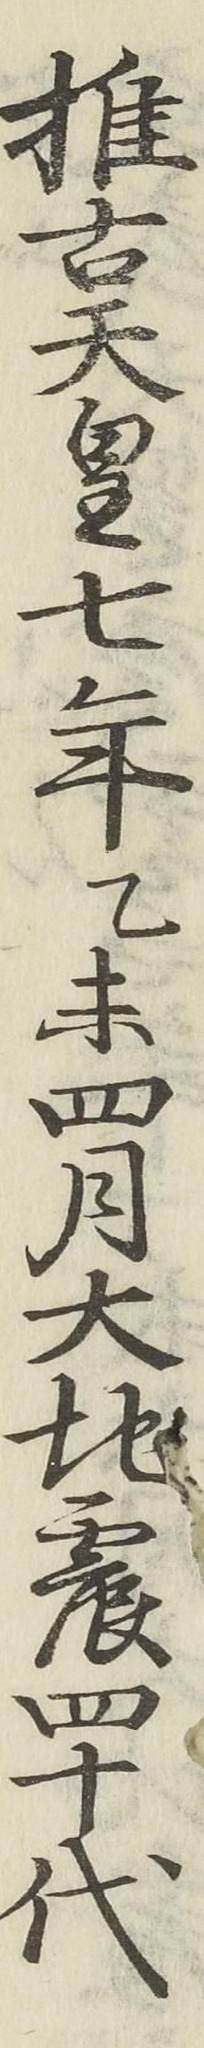推古天皇七年乙未四月大地震四十代
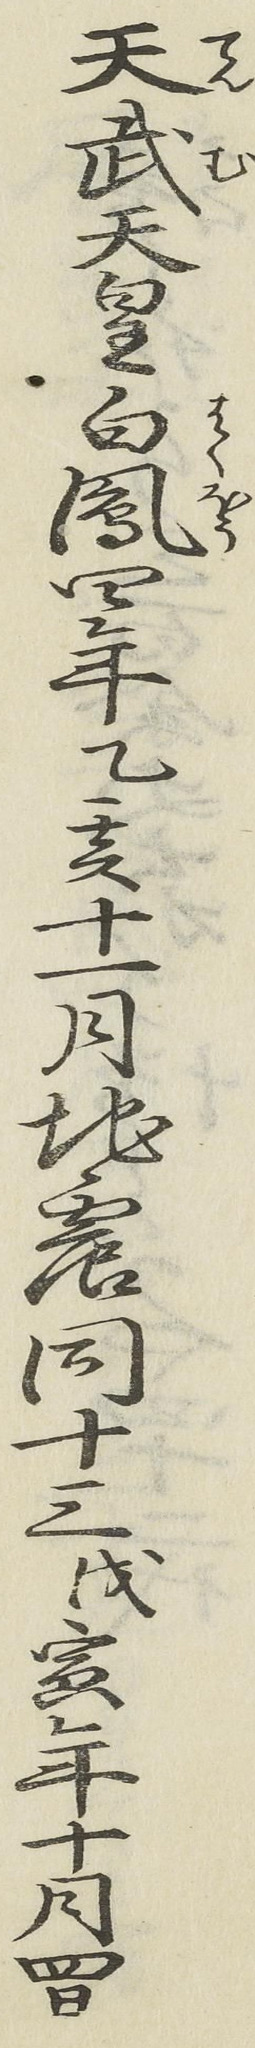天武天皇白鳳四年乙亥十一月地震同十三戊寅年十月四日
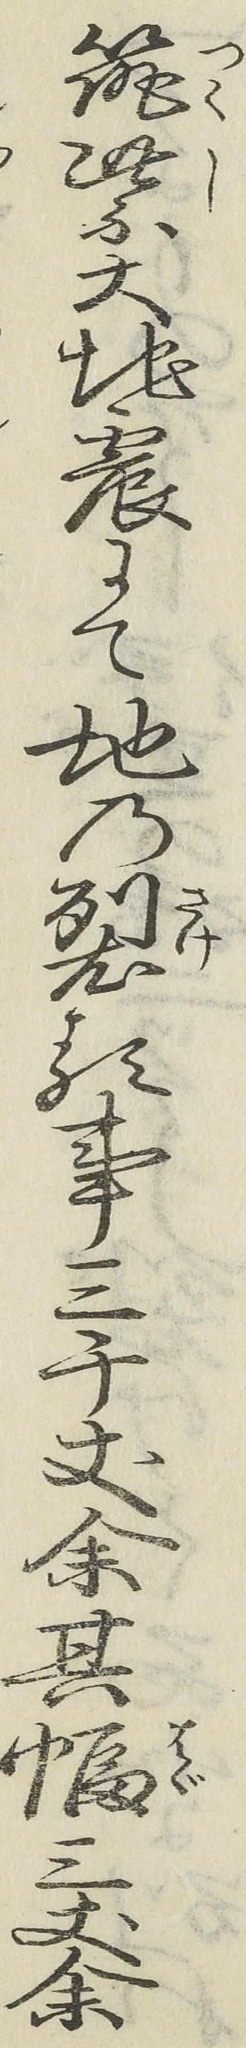筑紫大地震にて地の裂る事三千丈余其幅三丈余
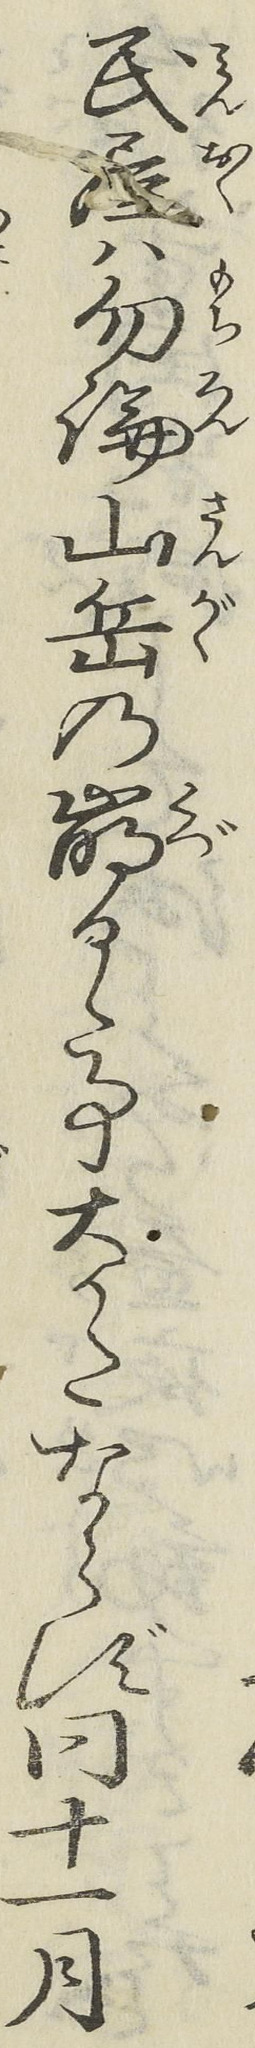民屋は勿論山岳の崩るゝ事大かたならず同十一月
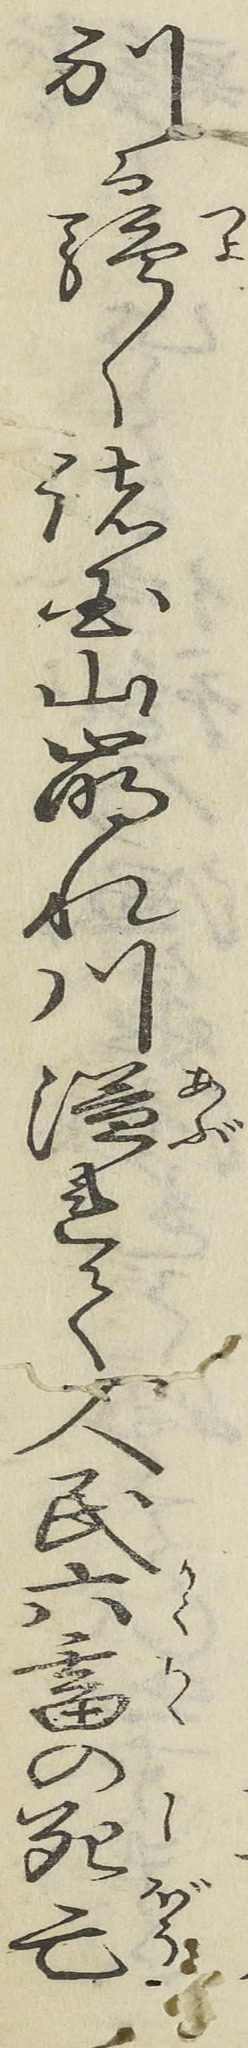別而強く諸国山崩れ川溢れて人民六畜の死亡
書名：震雷考説　全
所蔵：東京大学地震研究所図書室 Earthquake Research Institute Library, The University of Tokyo, JAPAN
